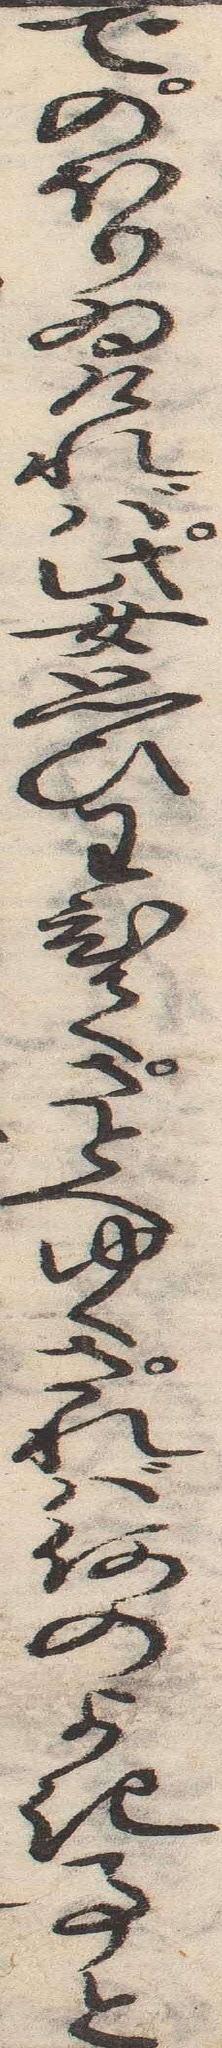で。のほりゐければ。此女思ひわひて。さとへゆく。されば何のよき事と
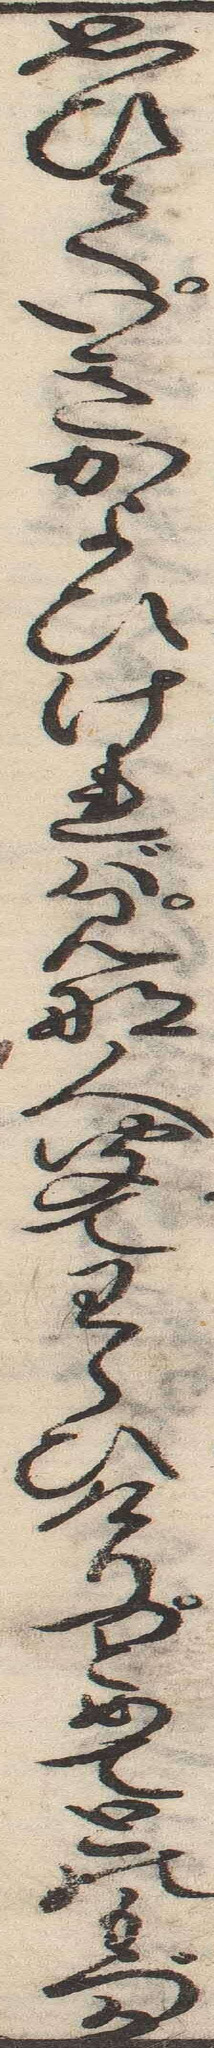思ひて。いきかよひければ。みな人聞てわらひけり。つとめてとのもづか

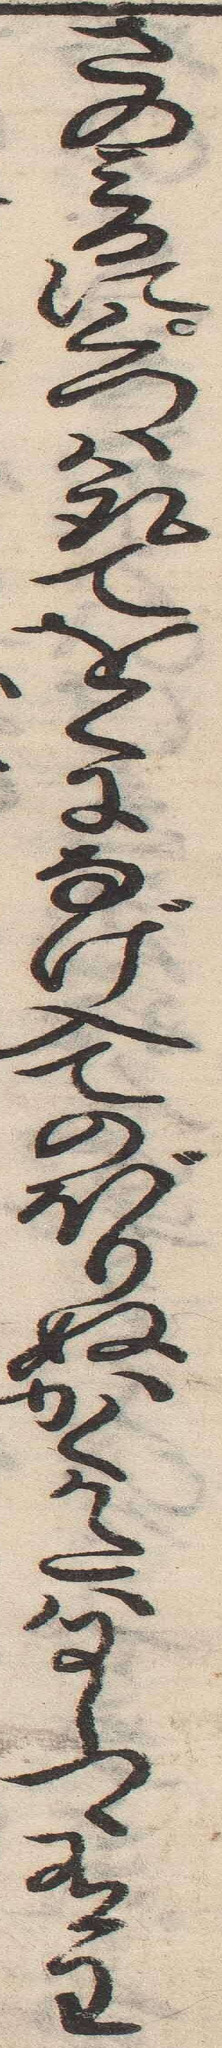さのみるに。くつは取てをくになげ入てのぼりぬかくかたはにしつゝ有わ
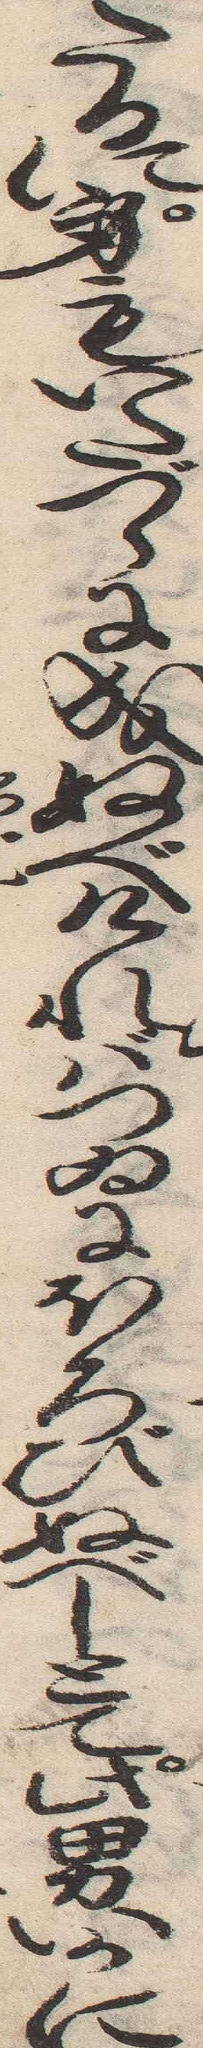たるに。身もいたづらに成ぬべければつゐにほろびぬべしとて。此男いかに
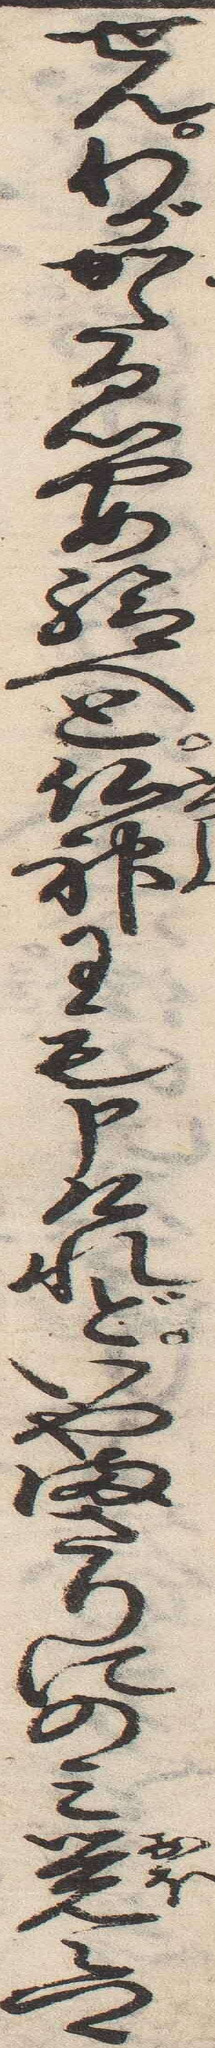せん。わがかゝる心やめ給へと。仏神にも申けれど。いやまさりにのみ覚えつゝ
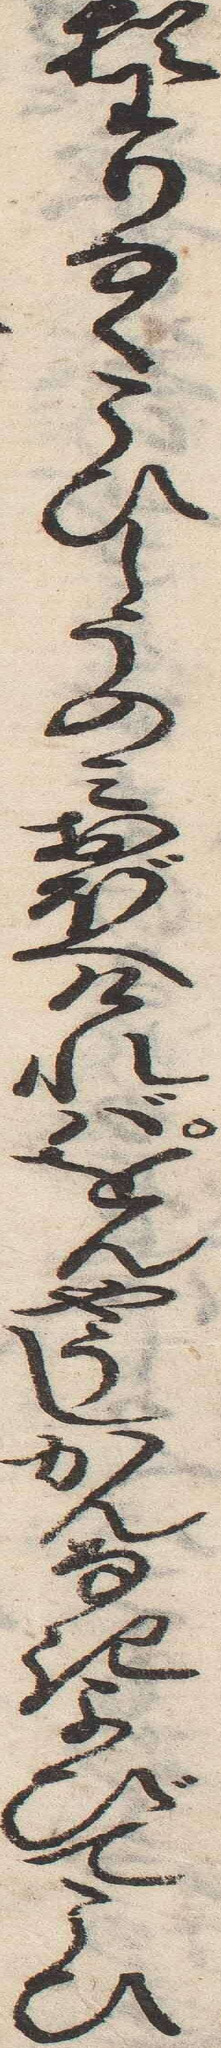猶わりなくこひしうのみおぼへければ。をんやうしかんなきよびてこひ
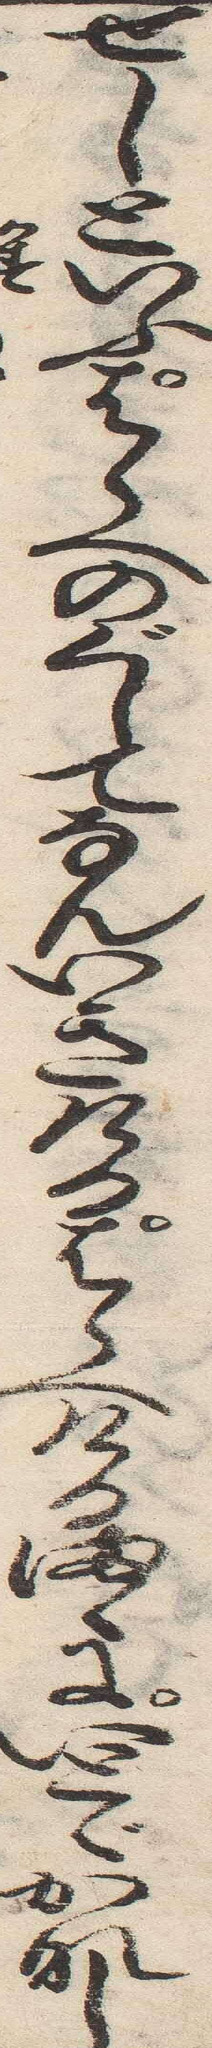せしといふ。はらへのぐしてなんいきける。はらへけるまゝに。いとゞかなし
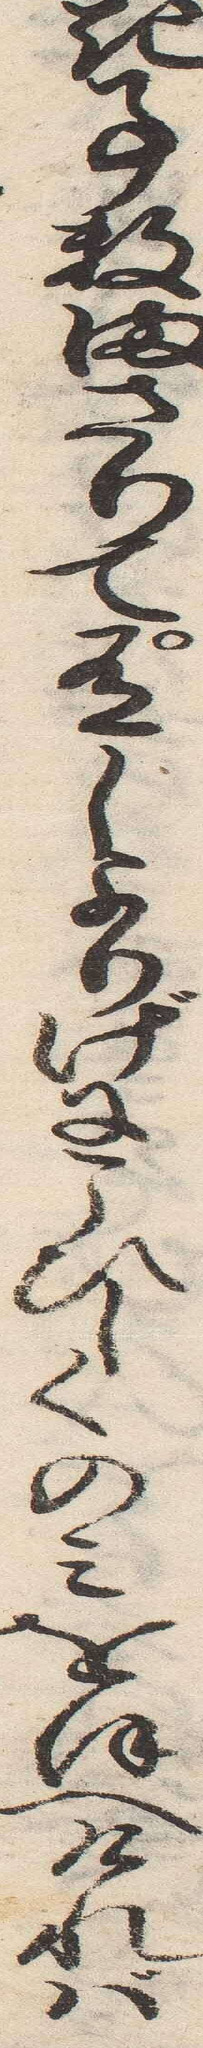き事数まさりて。有しよりげにこひしくのみをほへければ
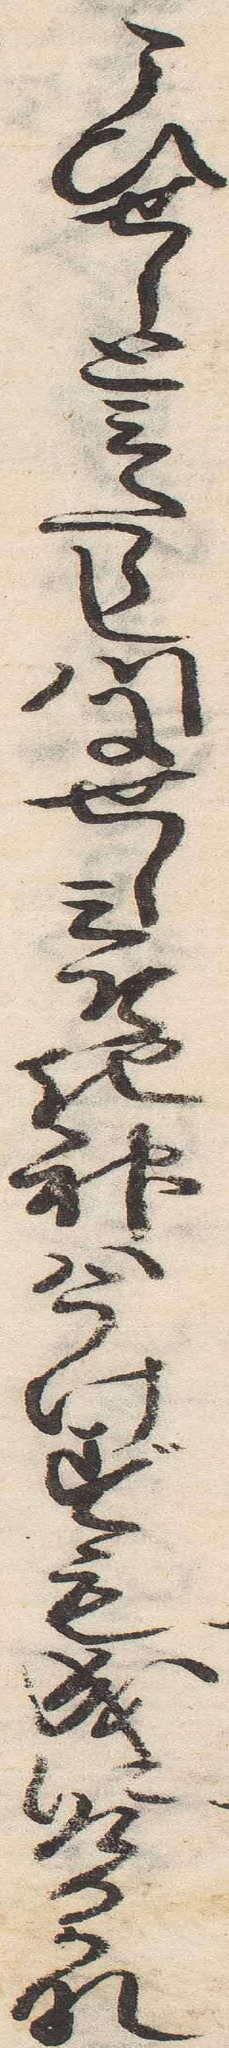こひせしとみたらし川にせしみそき神はうけずも成にけるかな
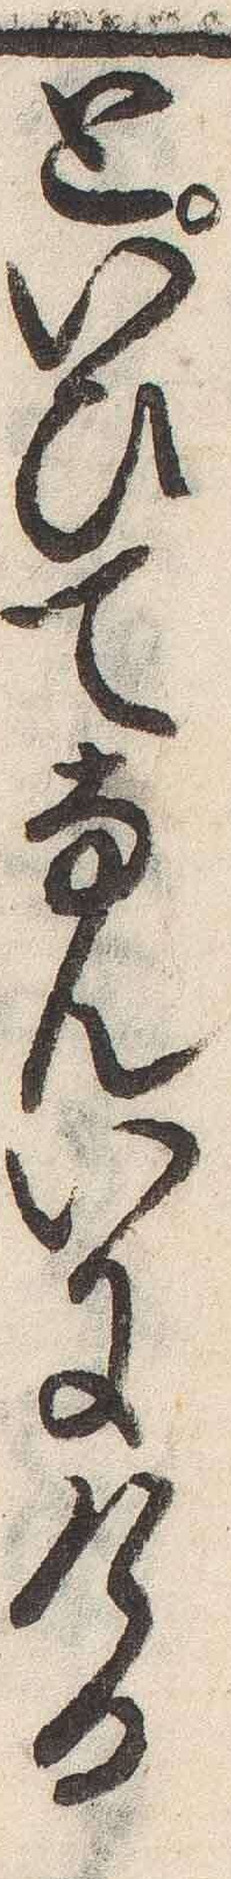と。いひてなんいにける
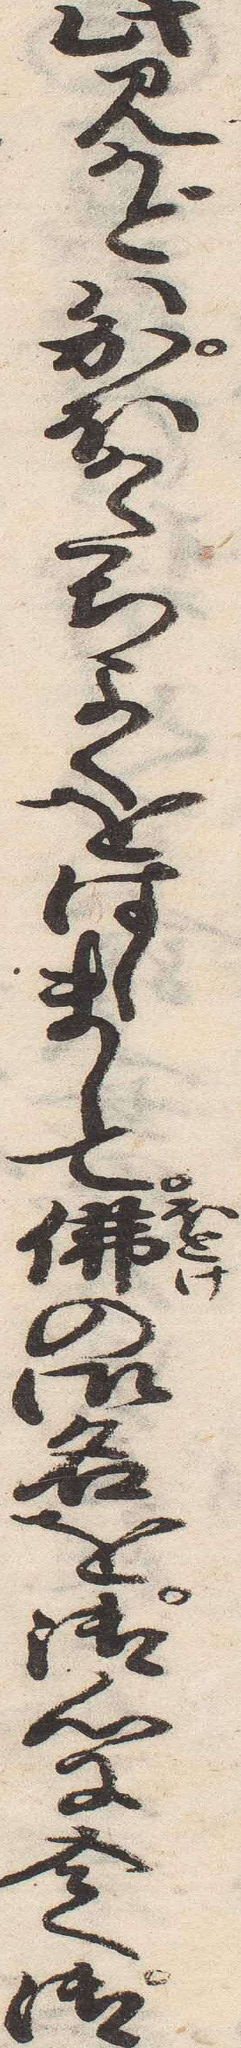此みかどは。かほかたちよくをはしまして。仏の御名を。御心に入て。御
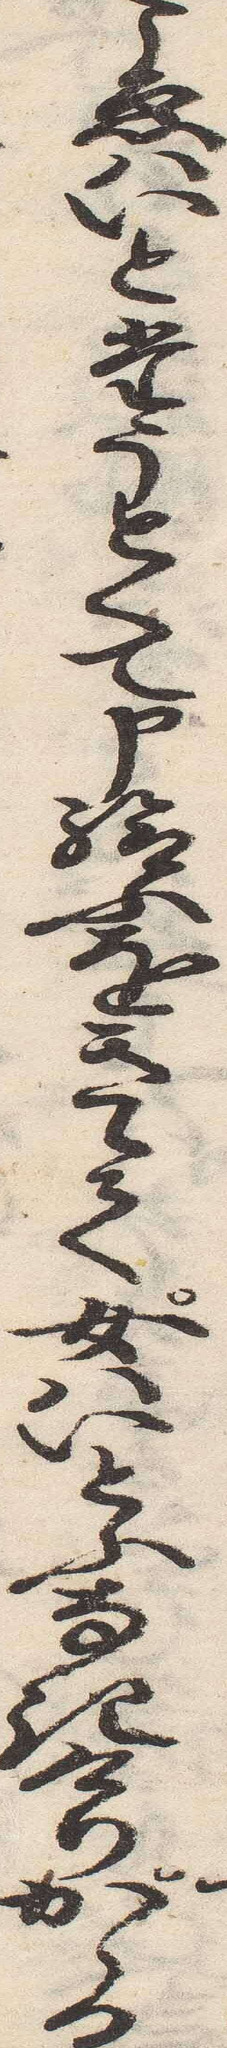こゑはいとたうとくて申給ふをきゝて。女はいとふなきけり。かゝる
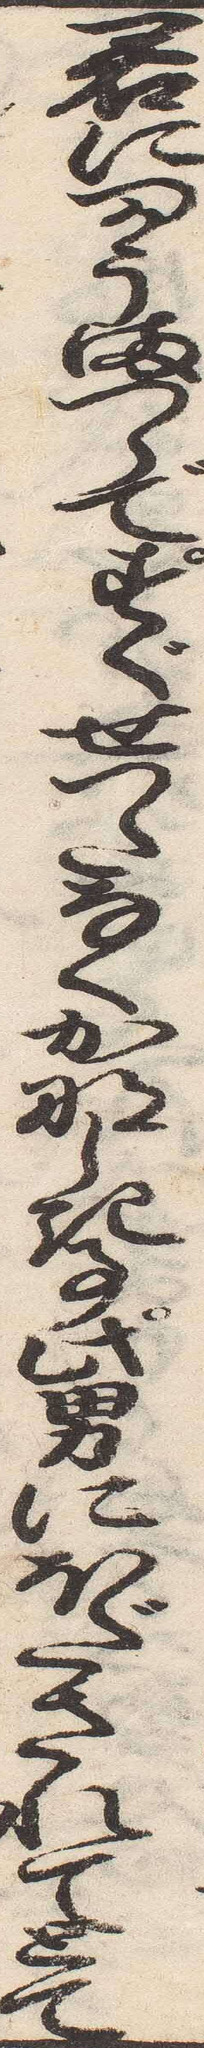君につかうまつらで。すぐせつたなくかなしき事。此男にほだされてとて
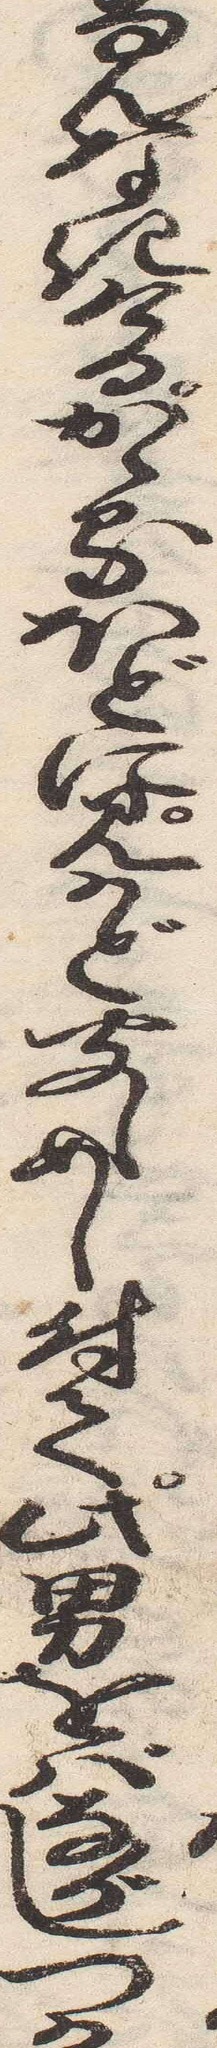なんなきける。かゝるほどに。みかど聞しめし付て。此男をばながしつか
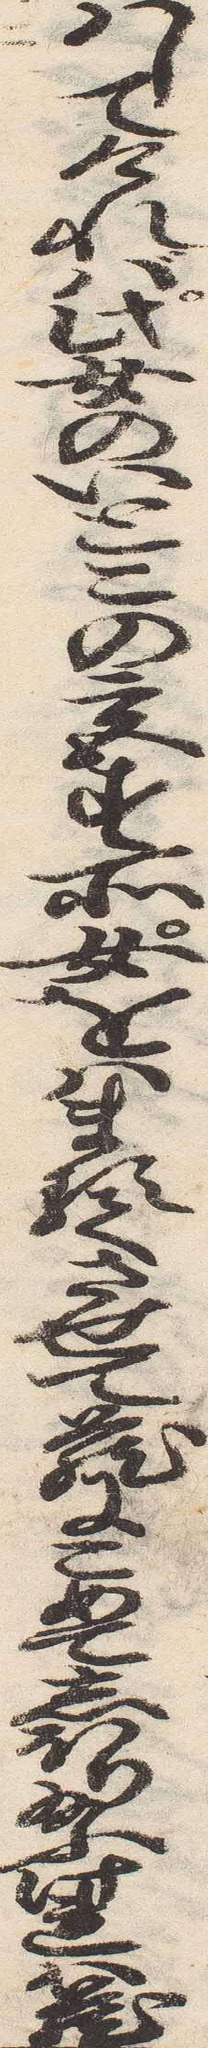はしてければ。此女のいとこの宮す所。女をはまるてさせて蔵にこめてしほり給ふけれは蔵

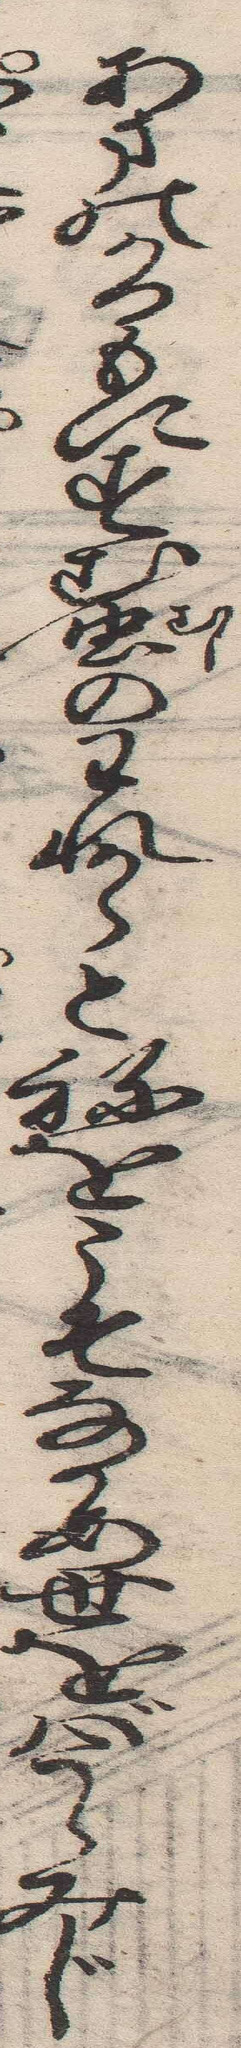あまのかるもにすむ虫のわれからとねをこそなかめ世をばうらみじ
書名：伊勢物語
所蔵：東京学芸大学附属図書館 国文学研究資料館
